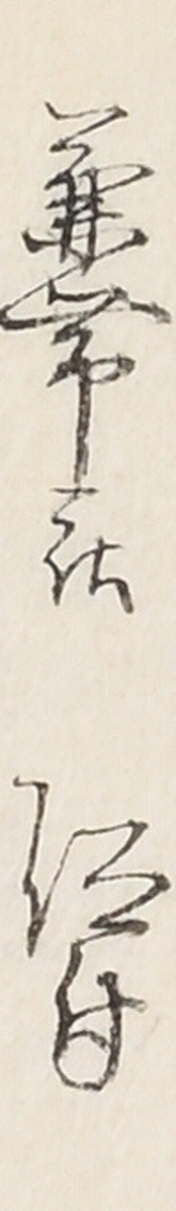兼帯被仰付
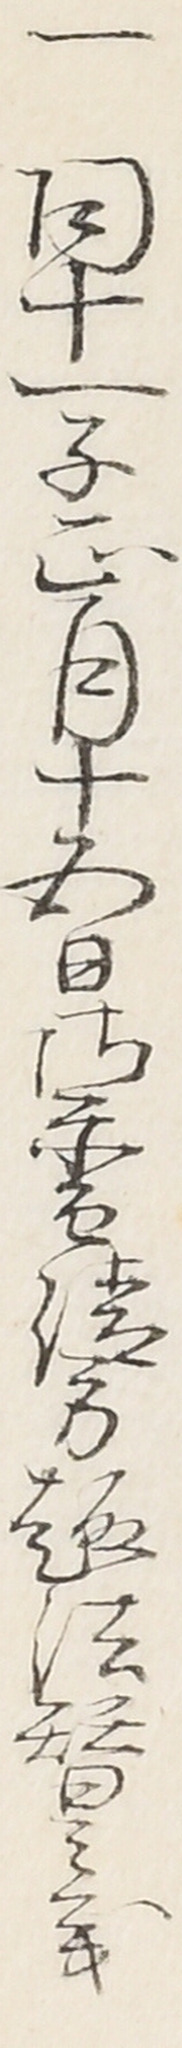一同十一子正月十五日御普請方趣法替之義
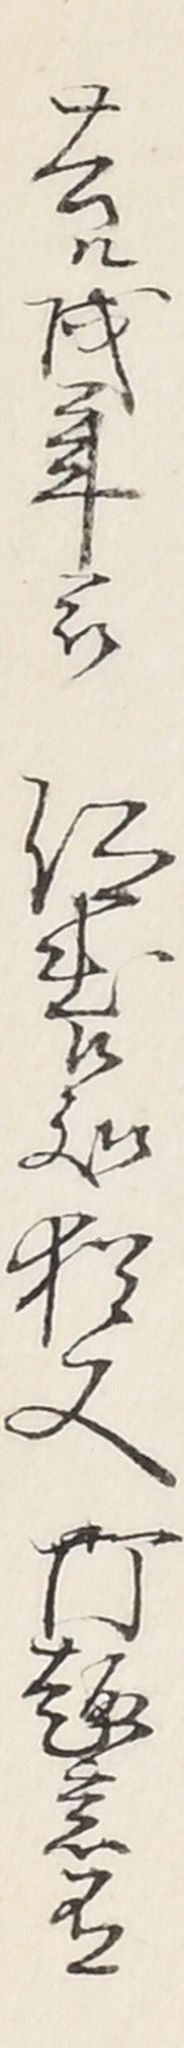去ル戌年被仰出候処猶又御趣意有
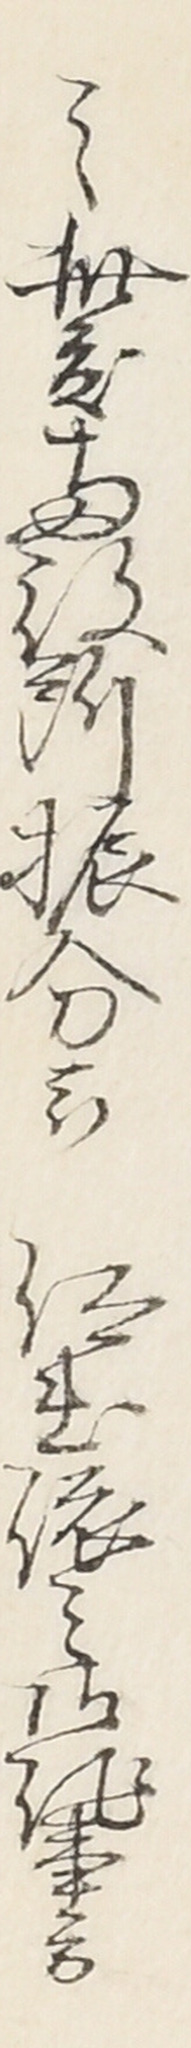之此度両役所振分被仰出依之依之御作事方
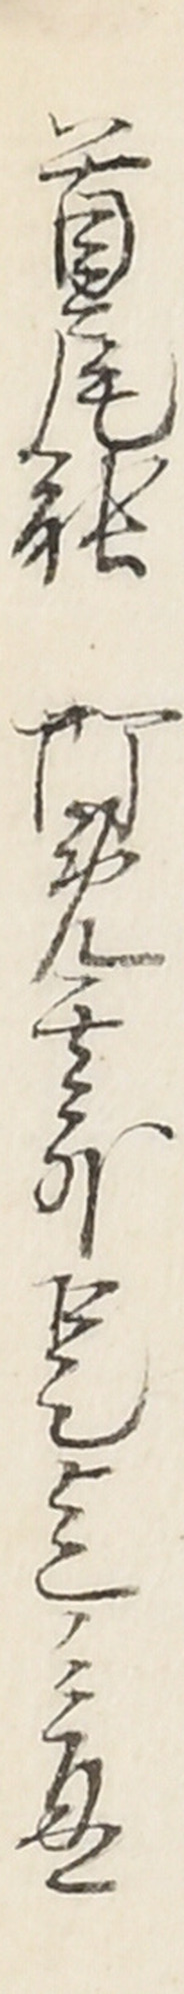首尾能御免其外是迄之通
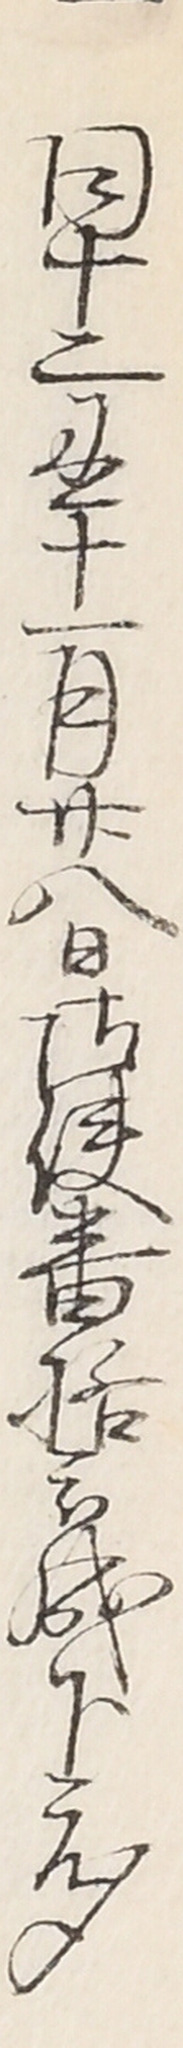一同十二丑十一月廿八日御使番格被成下元〆
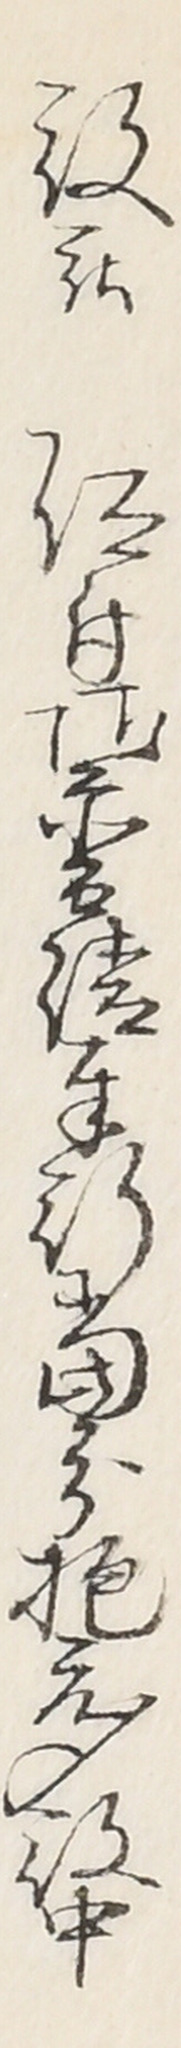役被仰付御普請奉行当分抱元〆役中
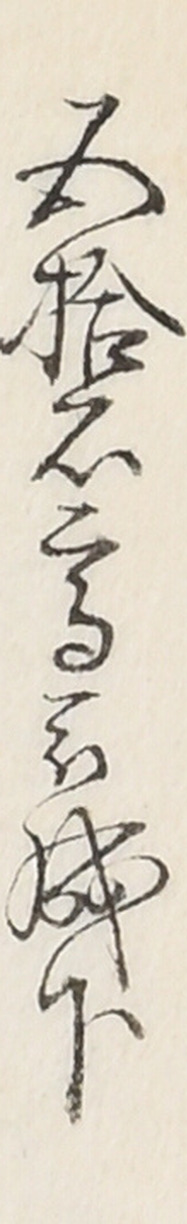五拾石高被成下
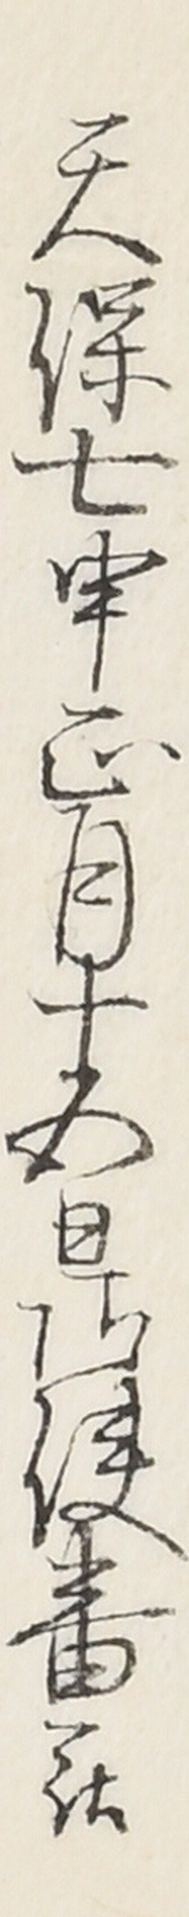一天保七申正月十五日御使番被
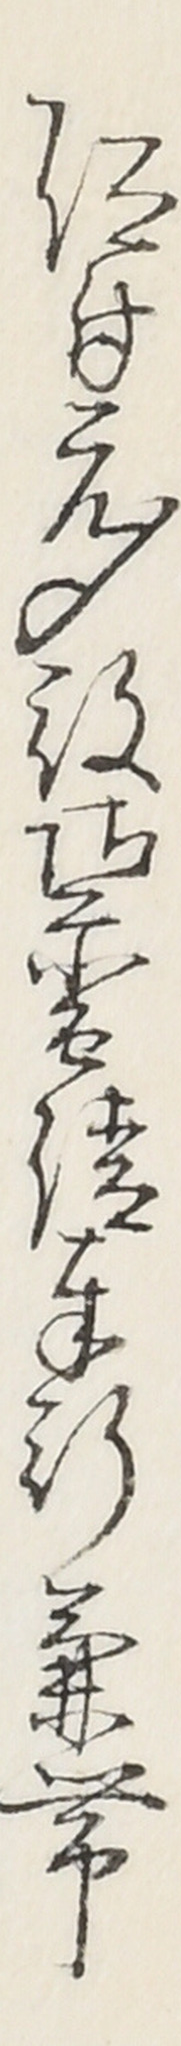仰付元〆役御普請奉行兼帯
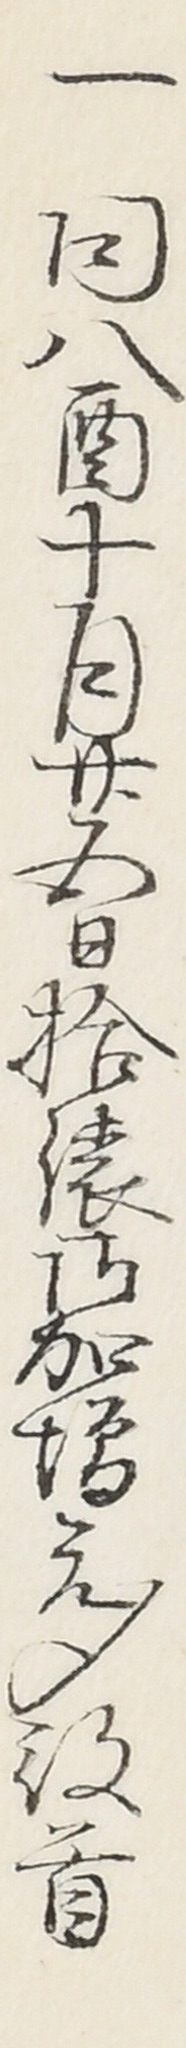一同八酉十月廿五日拾俵御加増元〆役首
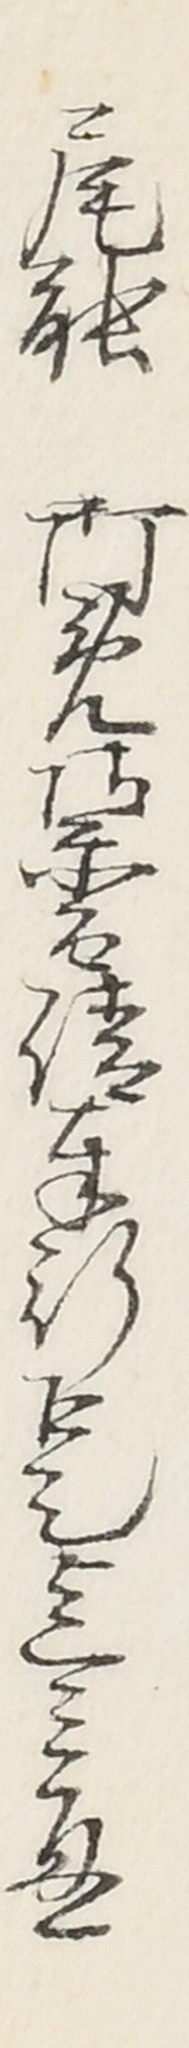尾能御免御普請奉行是迄之通
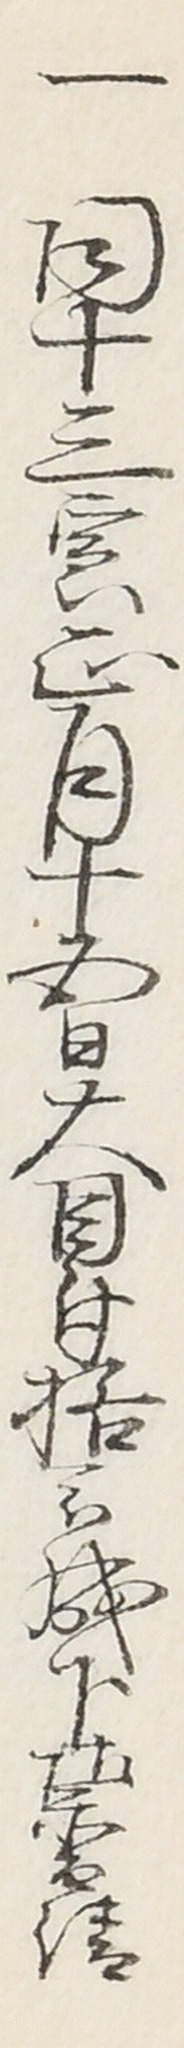一同十三寅正月十五日大目付格被成下御普請
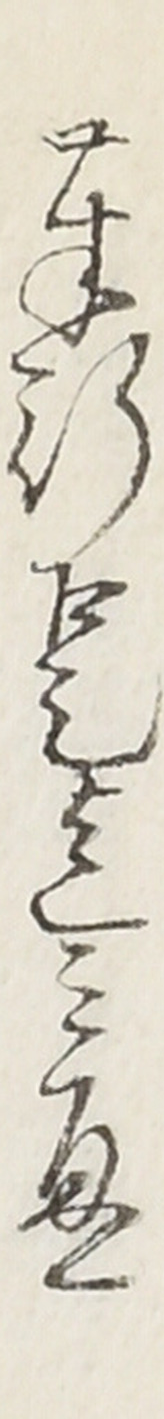奉行是迄之通
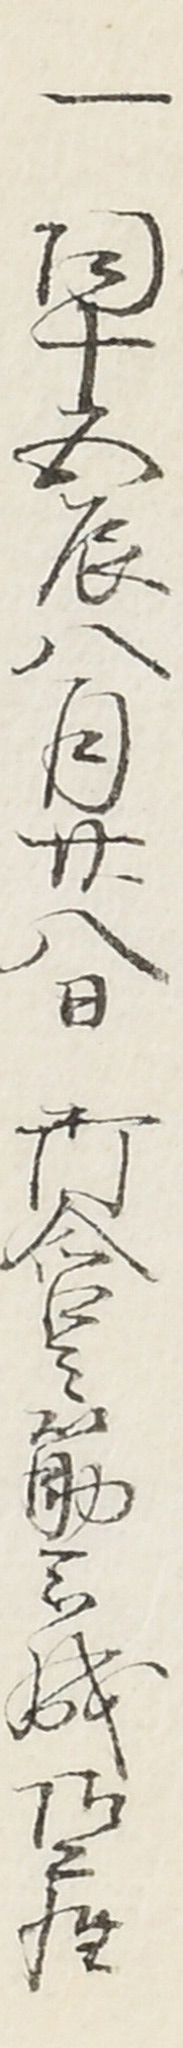一同十五辰八月廿八日御含之筋被成御座
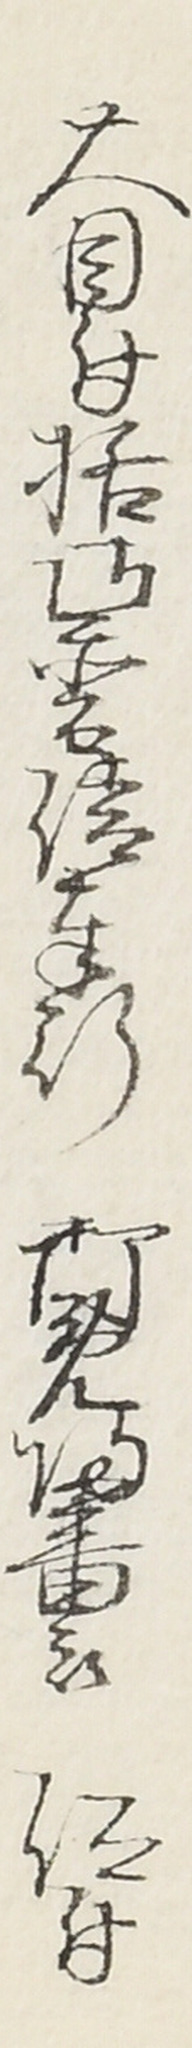大目付格御普請奉行御免帰番被仰付
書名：給人諸士勤仕録（七）
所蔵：伊那市立高遠町図書館・合同会社AMANE
